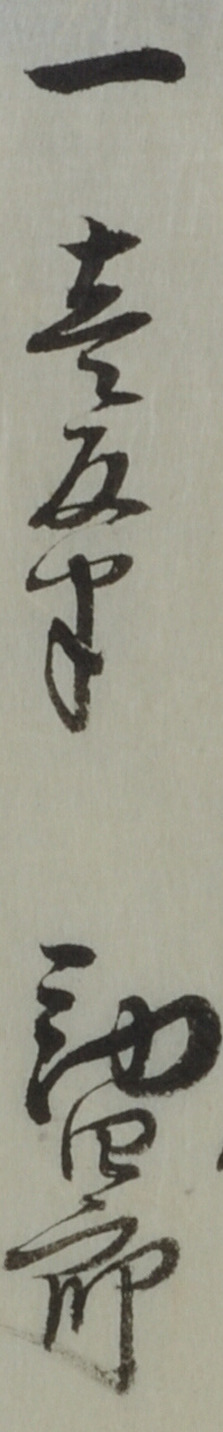一壱反半勘四郎
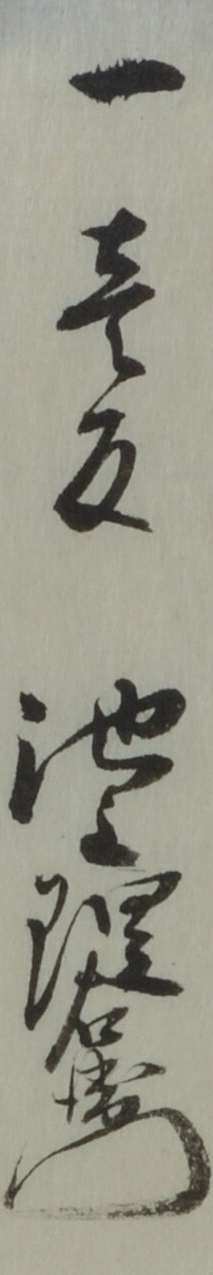一壱反池上理右衛門
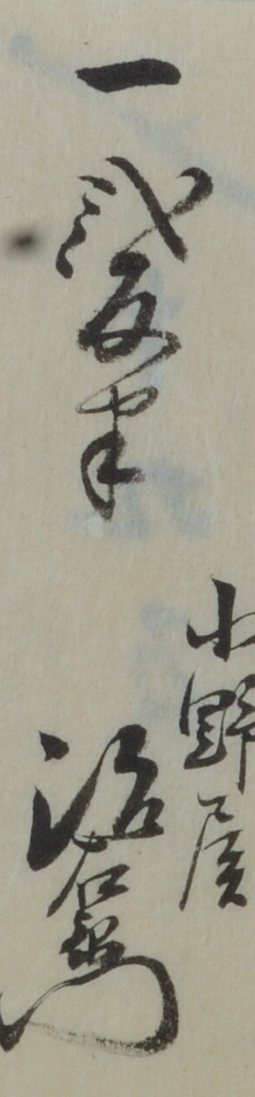一壱反市郎右衛門

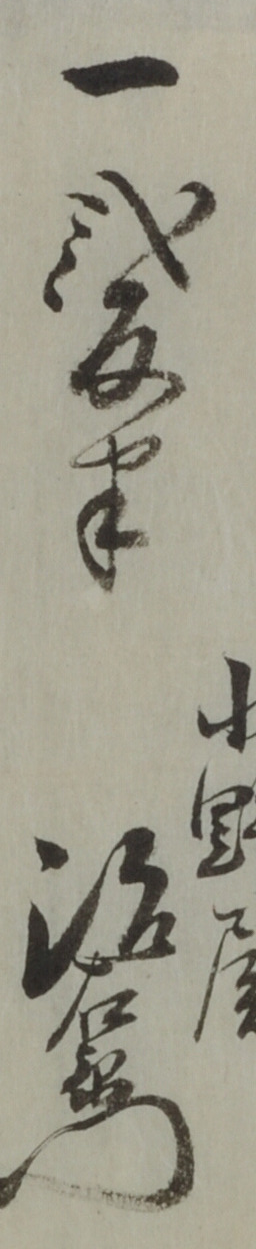一弐反半治右衛門
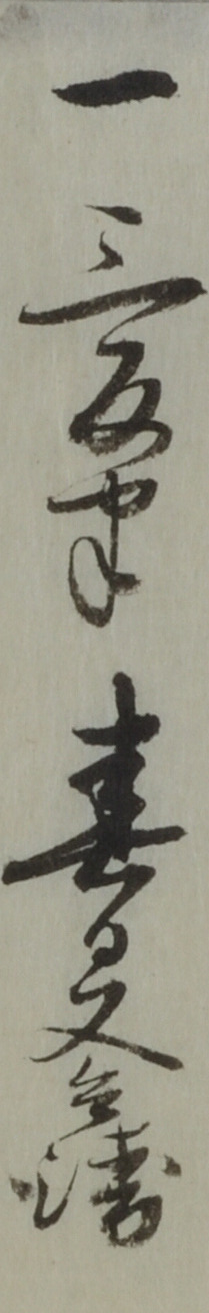一三反半春日又兵衛
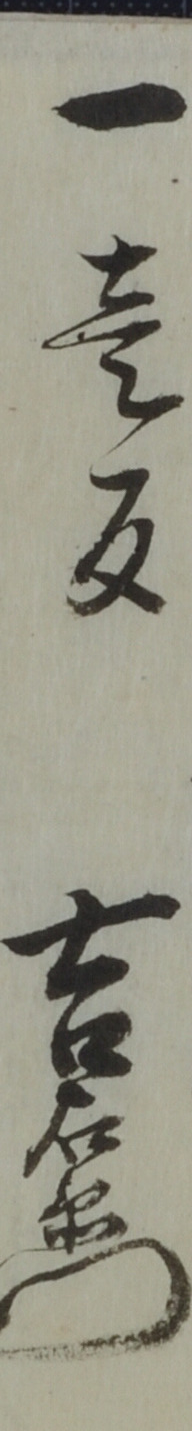一壱反吉右衛門
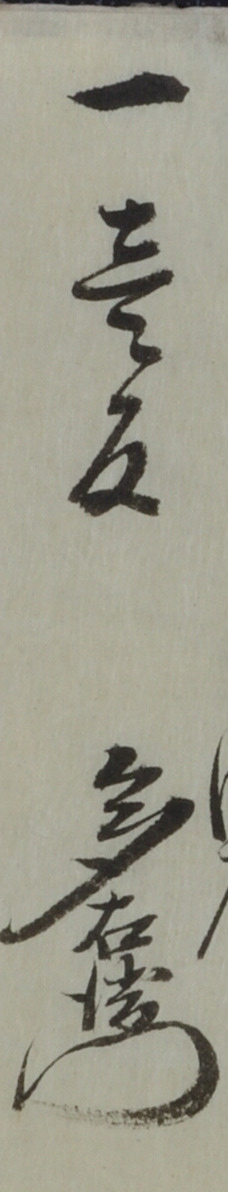一壱反多右衛門
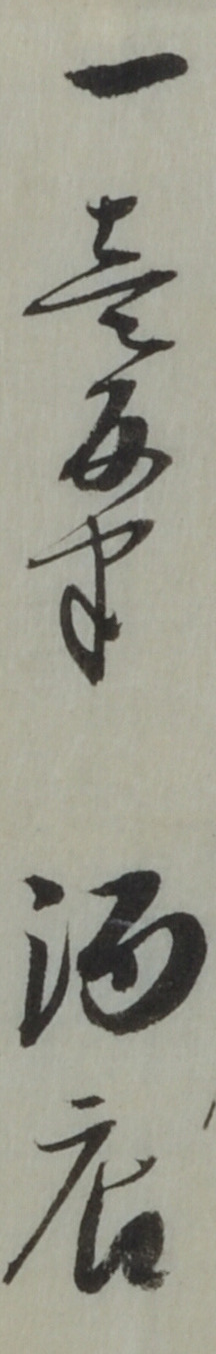一壱反半酒店

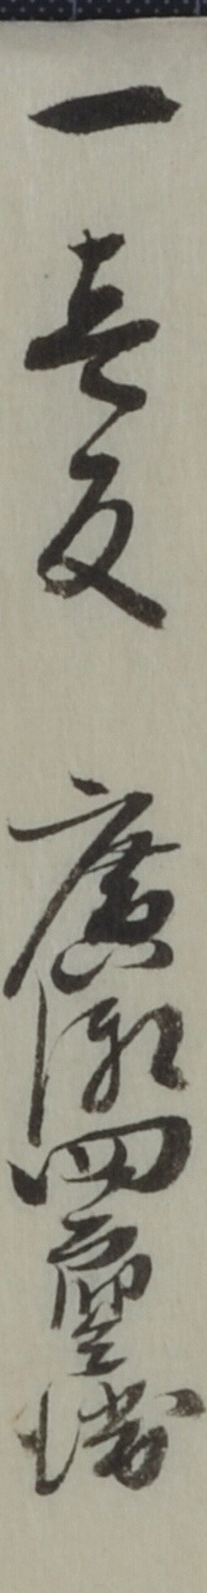一壱反広瀬四郎兵衛
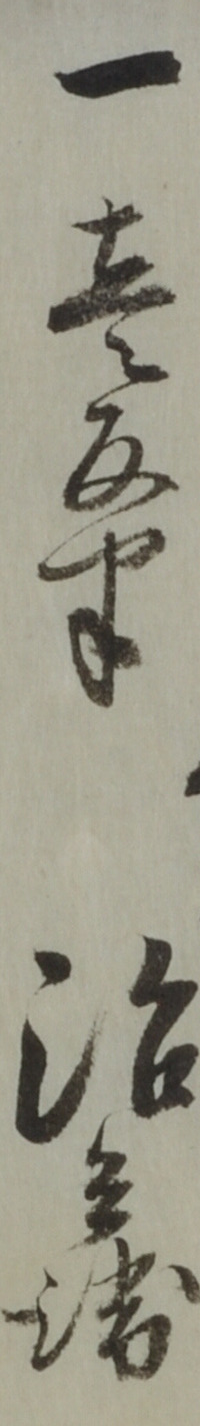一壱反半治兵衛
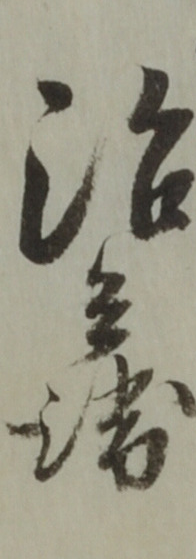宗兵衛
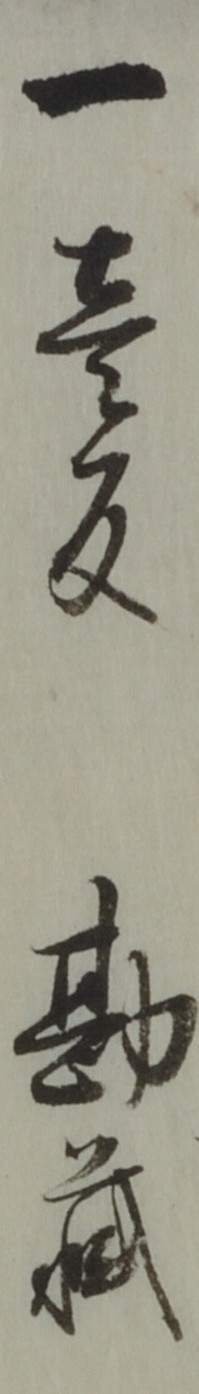一壱反勘蔵
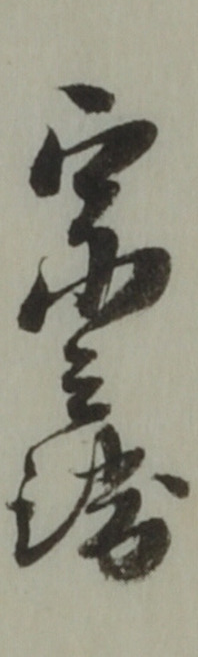宗兵衛
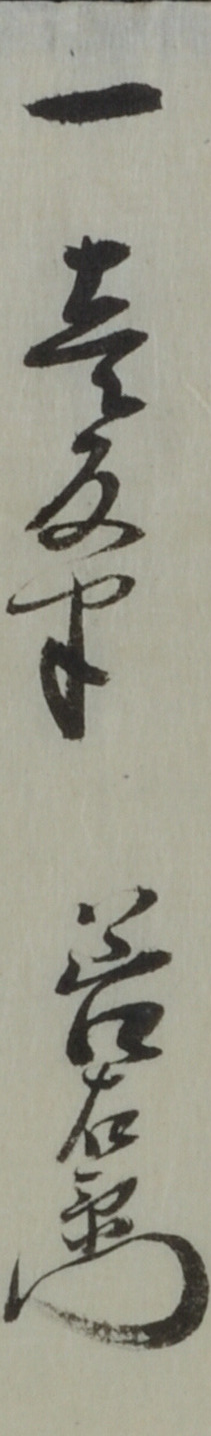一壱反半善右衛門
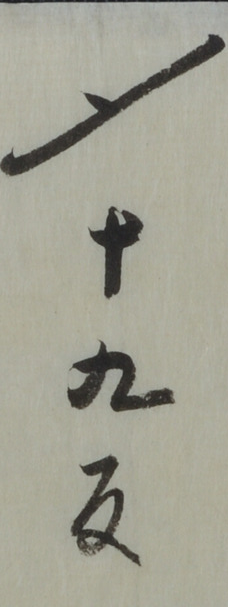〆十九反

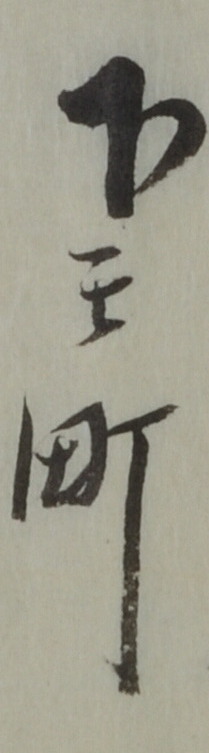下モ町
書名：融通割合帳
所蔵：伊那市立高遠町図書館・合同会社AMANE
